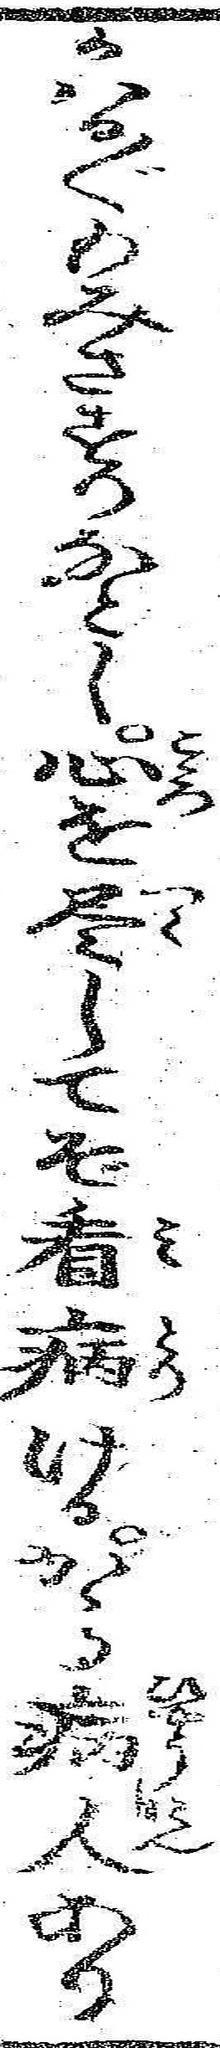かはる〴〵もみさすりなとし。心を尽してぞ看病ける。かゝる病人あり
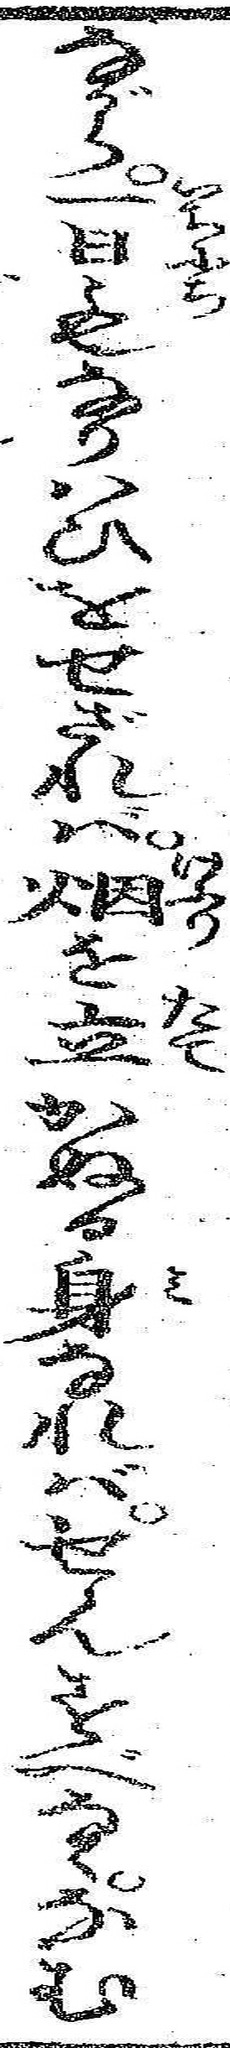ながら。一日もなりはひをせざれば。煙を立かぬる身なれば。せんすべなく。なむ
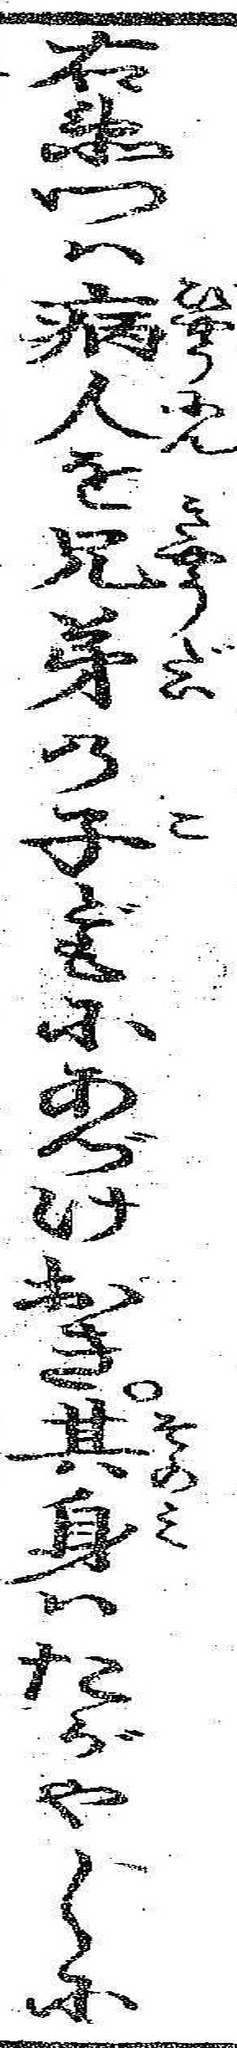右衛門は病人を兄第の子どもにあづけおき。其身はたがやしに
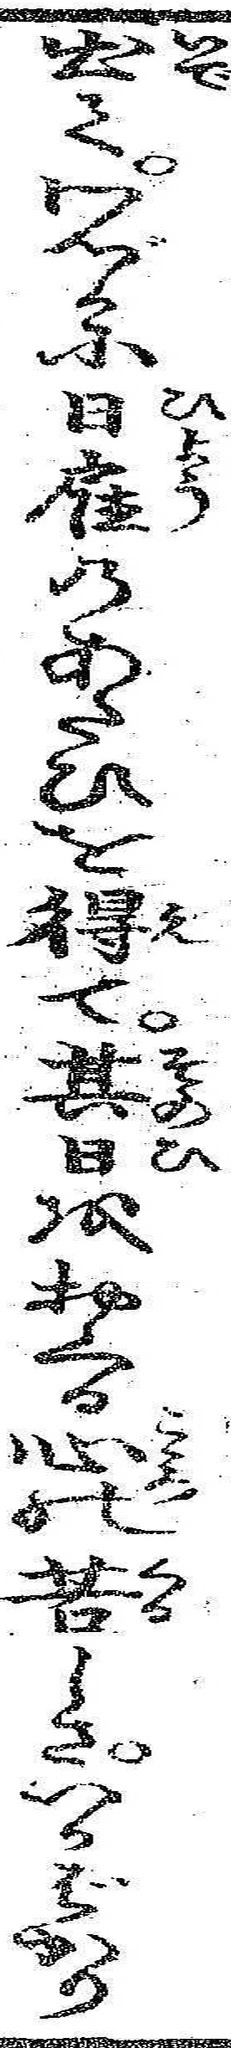出て。わづかに日雇のあたひを得て。其日をおくる心の苦しさ。いかばかり
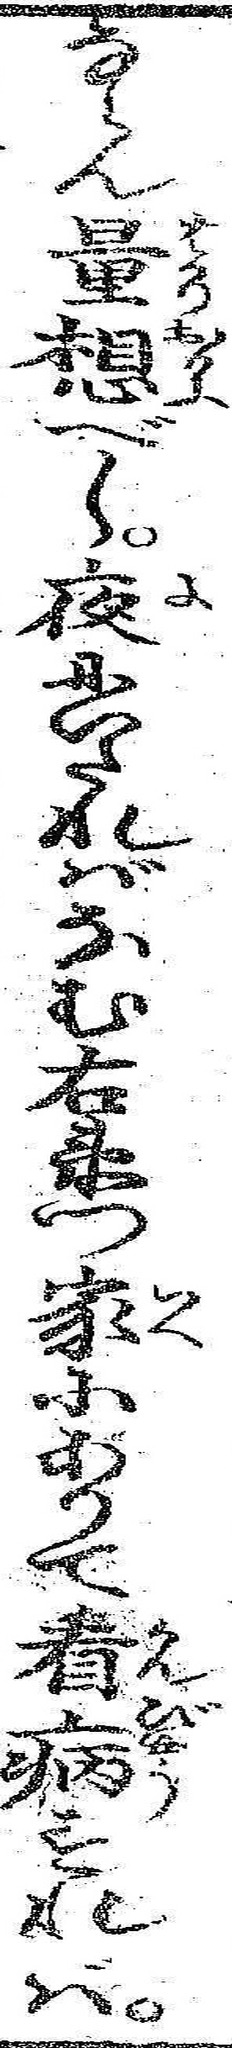ならん量想べし。夜にいたればなむ右衛門家にありて看病すれば。
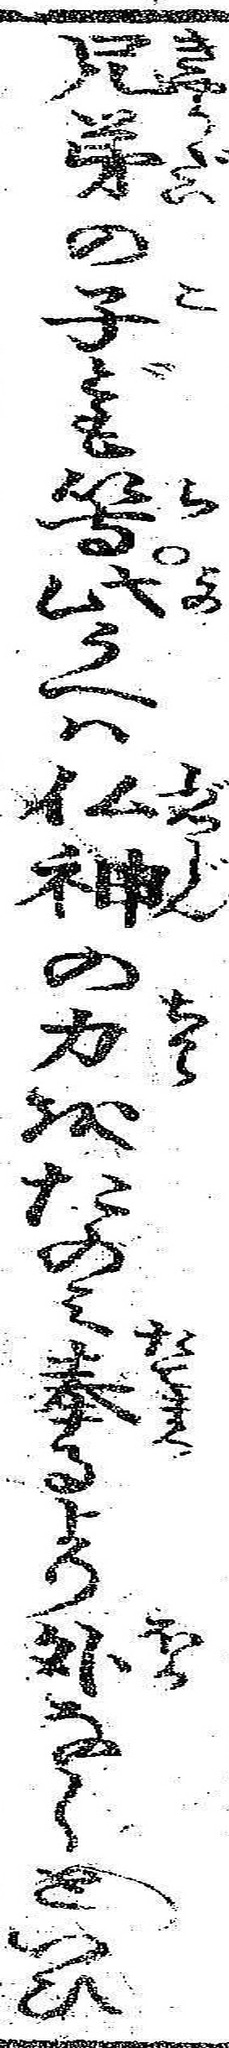兄第の子ども等。此うへは仏神の力をたのみ奉るより外なしといひ
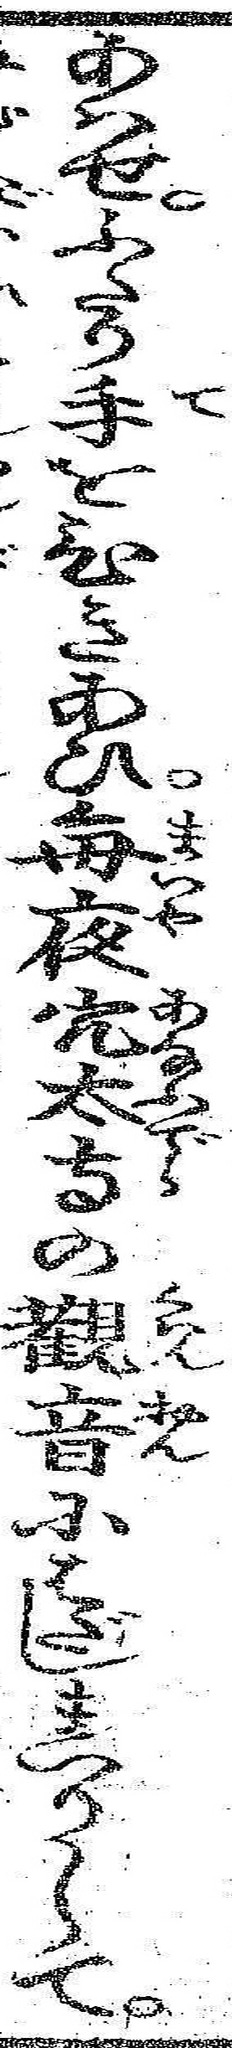あはせ。ふたり手をひきあひ。毎夜穴太寺の観音にはだしまいりして。
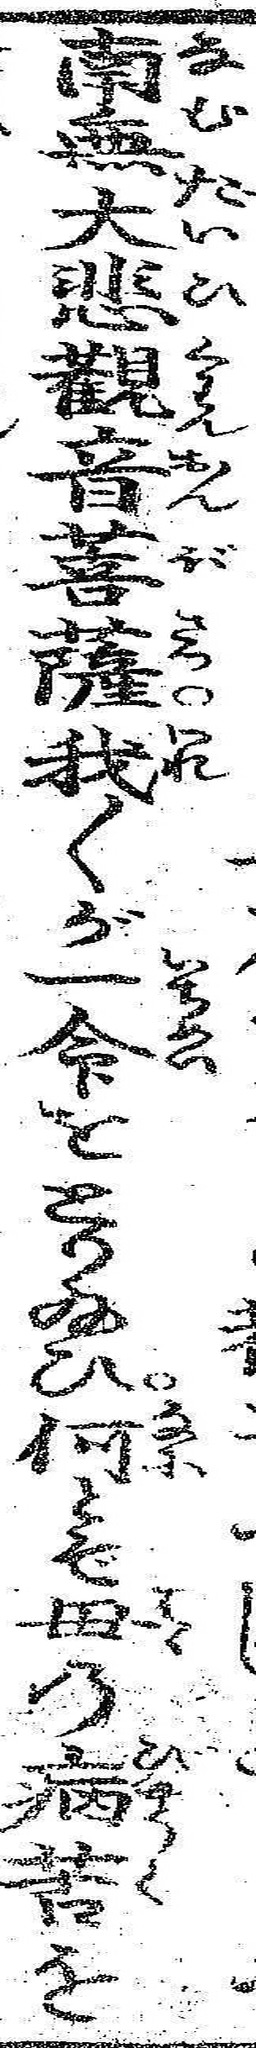南無大悲観音菩薩。我々が一命をとり給ひ。何とぞ母の病苦を
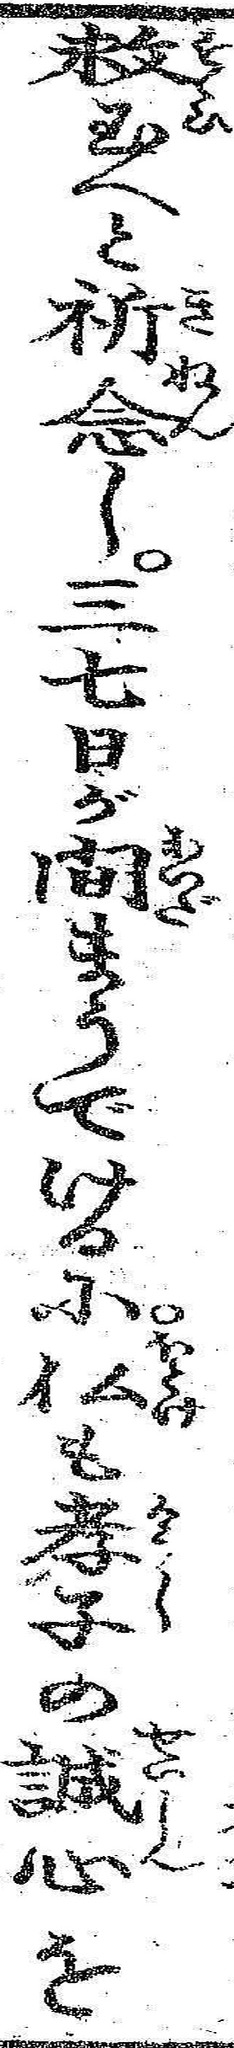救玉へと祈念し。三七日が間まうでけるに。仏も孝子の誠心を

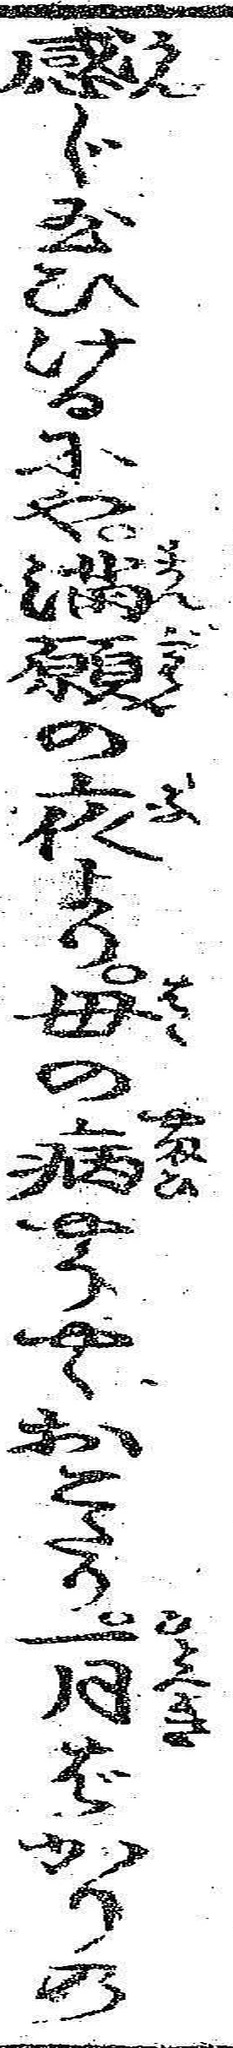感じ玉ひけるにや。満願の夜より。母の病やうやくおこたり。一月ばかりの
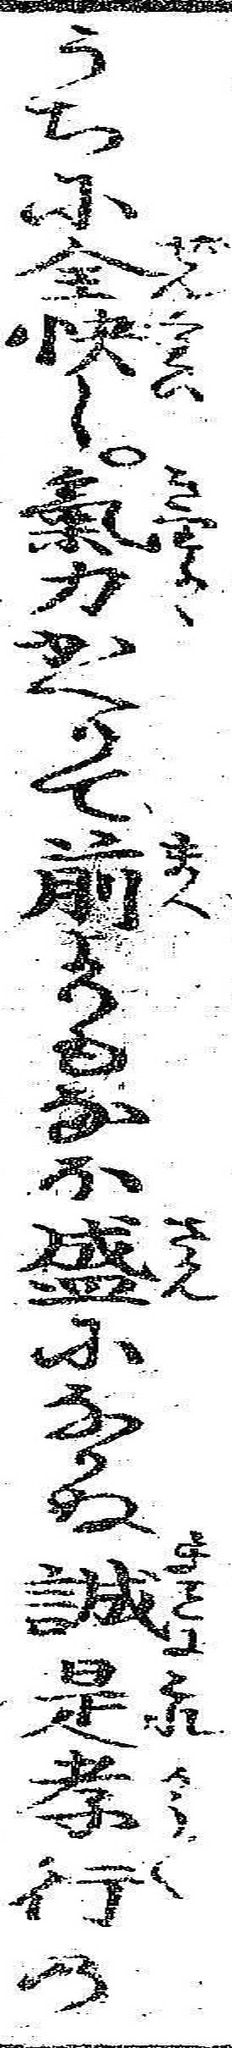うちに全快し。気力かへりて前よりもなほ盛になりぬ誠是孝行の
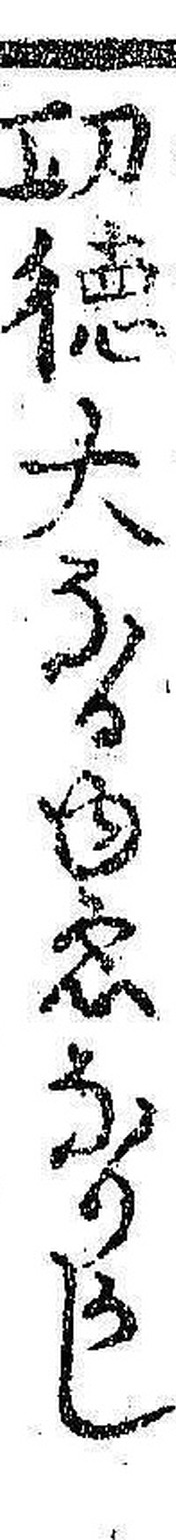㓛徳大なるるゆゑなりかし
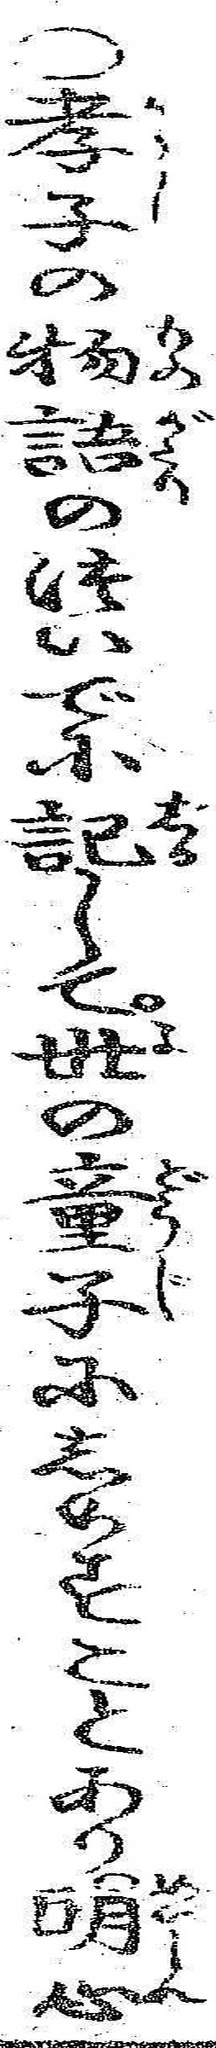○孝子の物語のついでに記して。世の童子にしめすことあり。明心
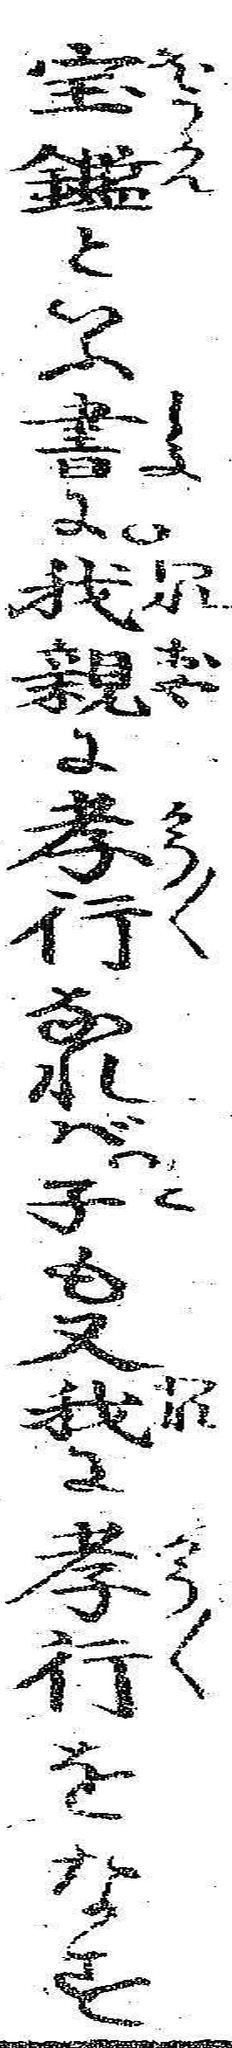宝鑑といふ書に。我親に孝行なれば。子も又我に孝行をなす
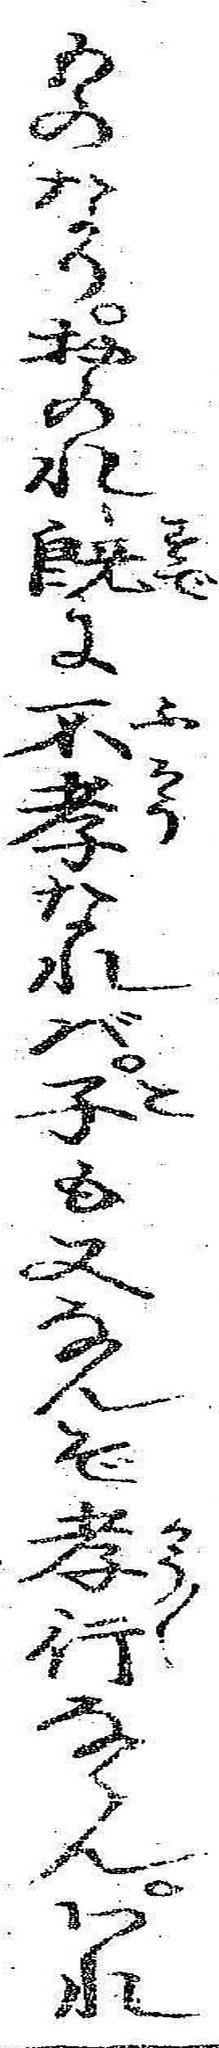ものなり。おのれ既に不孝なれば。子も又なんぞ孝行ならん。われ
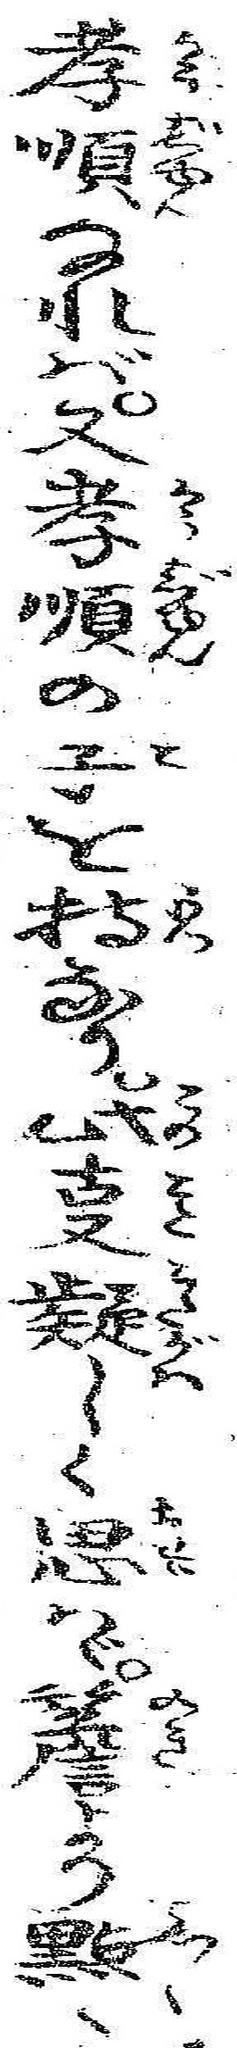孝順なれば。又孝順の子を持なり。此事疑しく思はゞ。簷より点々
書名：昔話稲妻表紙
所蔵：国文学研究資料館
